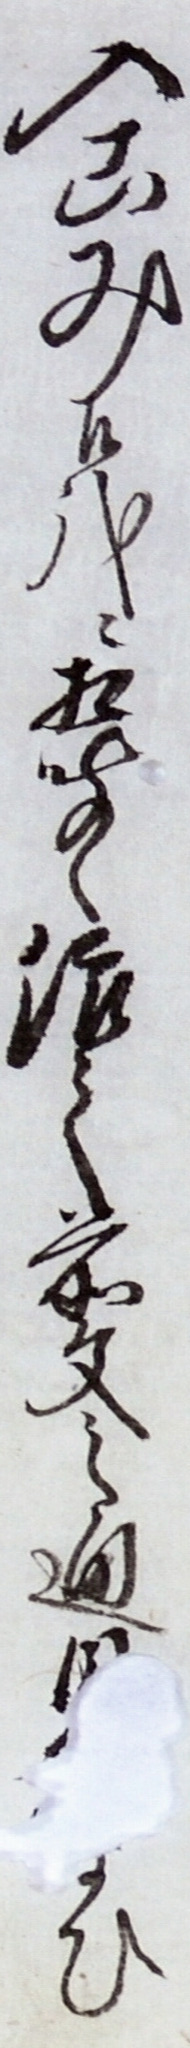入こみ候哉に相聞候依之前文之通用ひ
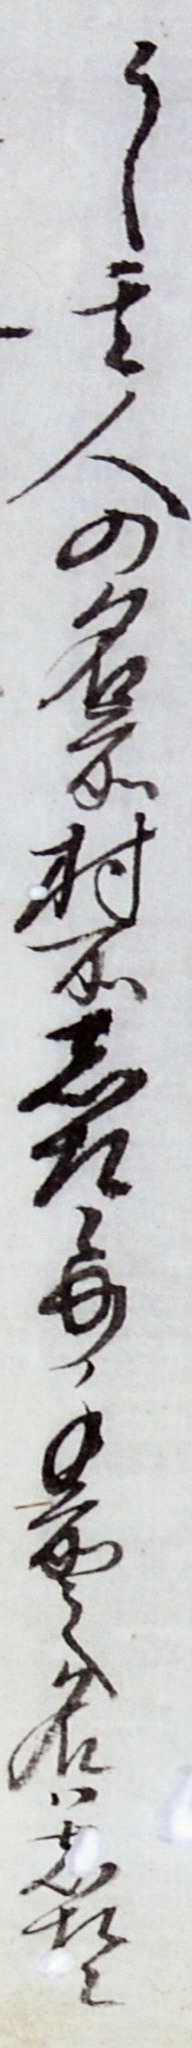とし其人の名前村所したとせる手前之名ハ志古と
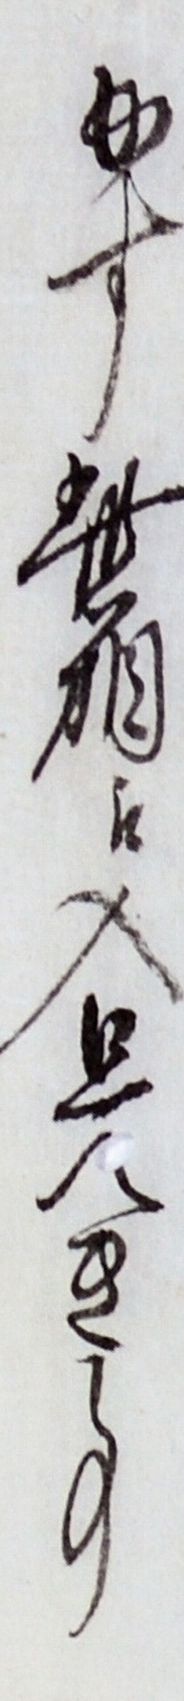出す此箱江入且八き事

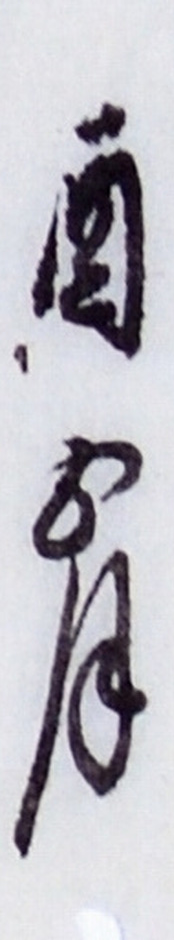酉五月
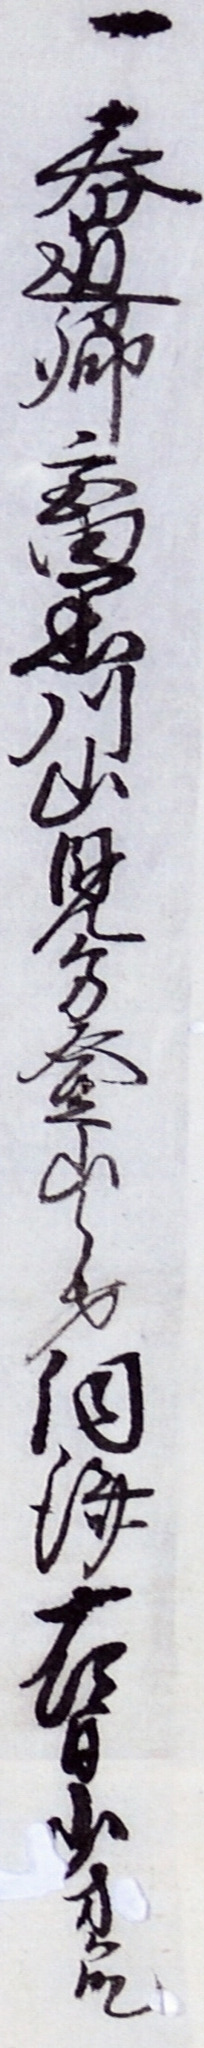一春近郷宮田黒川山見方登山之義伺済右目少付衆
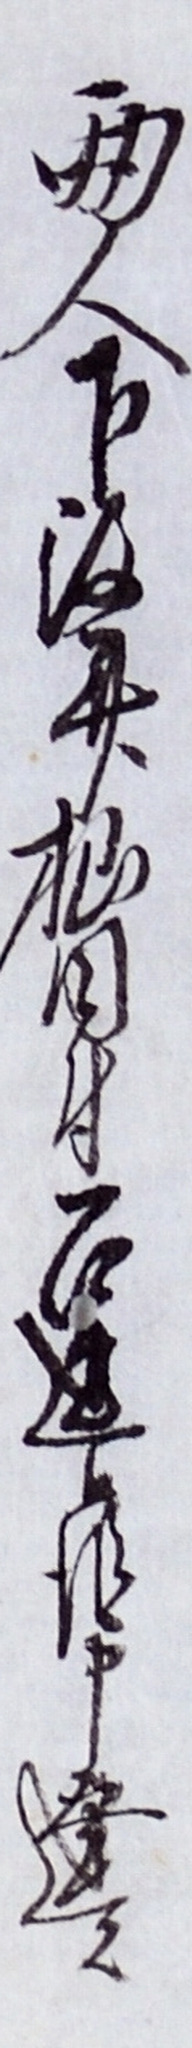両人下役并杣目付石候段申達ス
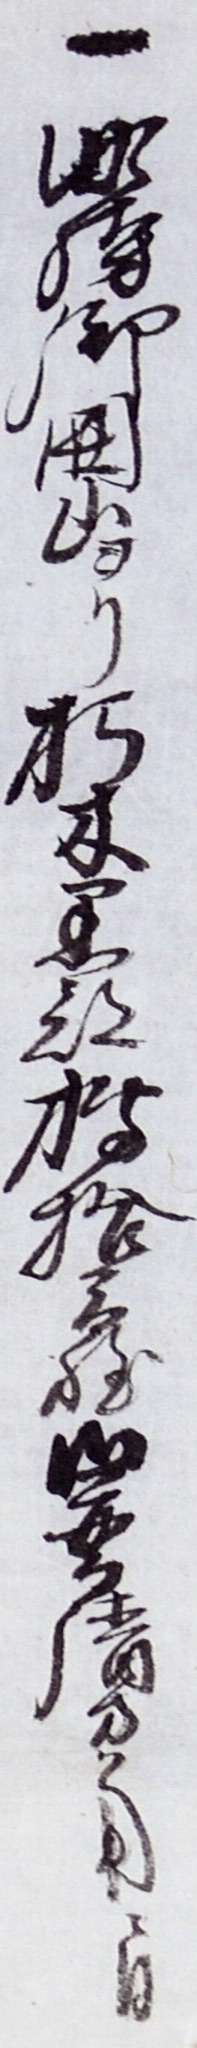一非持御囲山ヨリ朽木黒部樽拾三程御普請具用に付
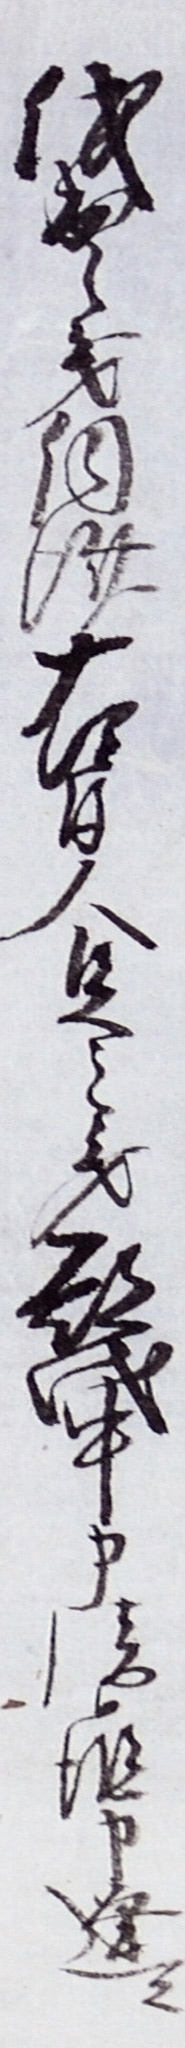伐出之義付済右付人足之義郡代中申談候段申達ス
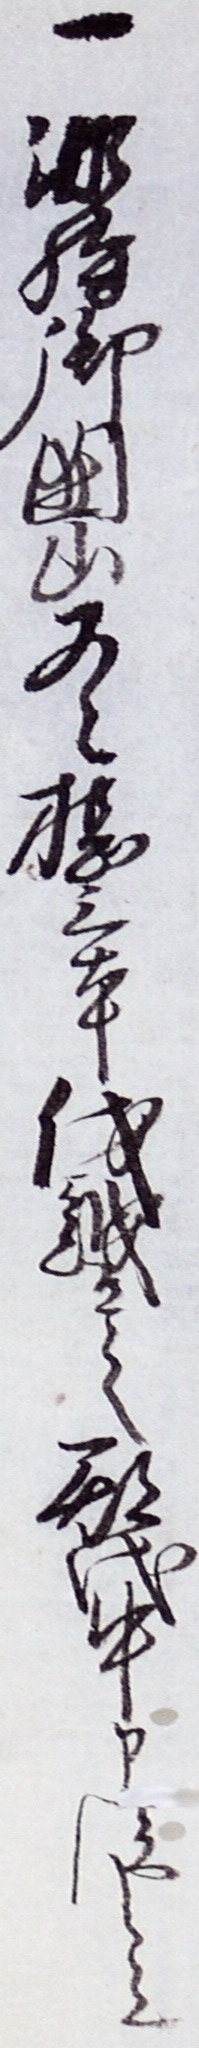一非持御囲山又々椹三本伐越有之郡代中申談之以
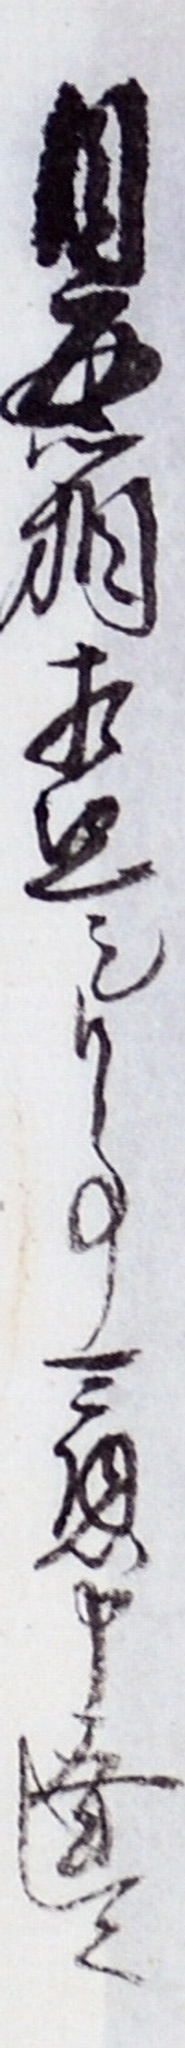目通相廻シ候事可応申達候
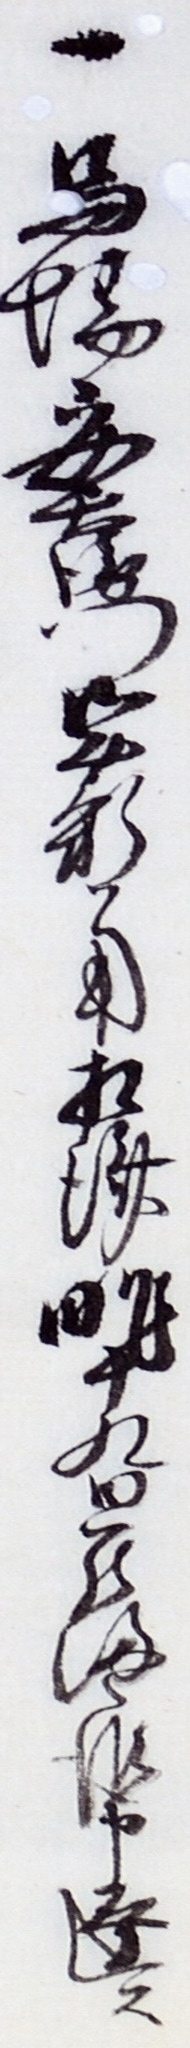一馬場安右衛門御新用相済昨十九日罷帰候段申達ス
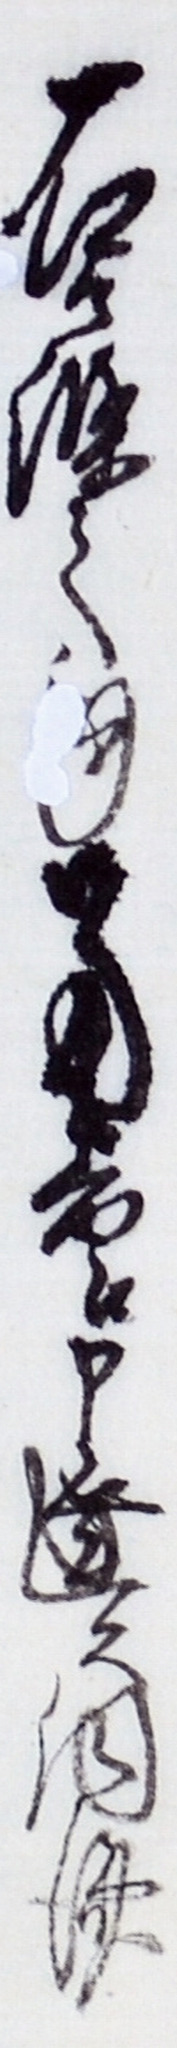右ケ條之御用番江申達ス伺済
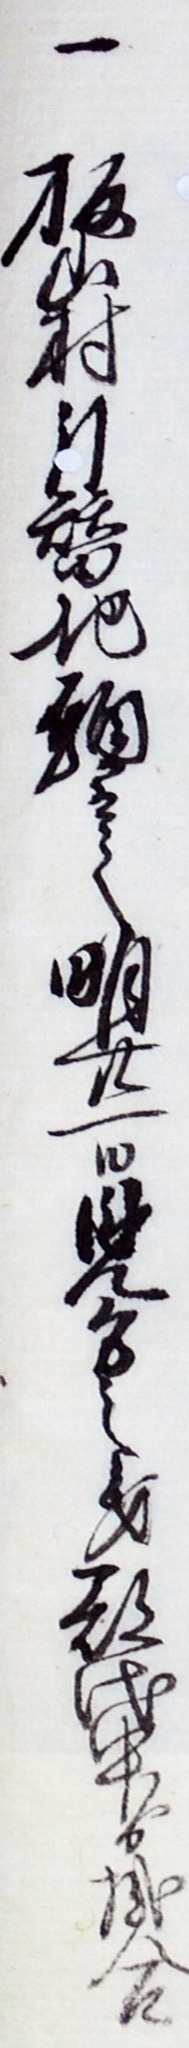一板弐村引替地願有之明廿一日見方之義郡代中より掛合
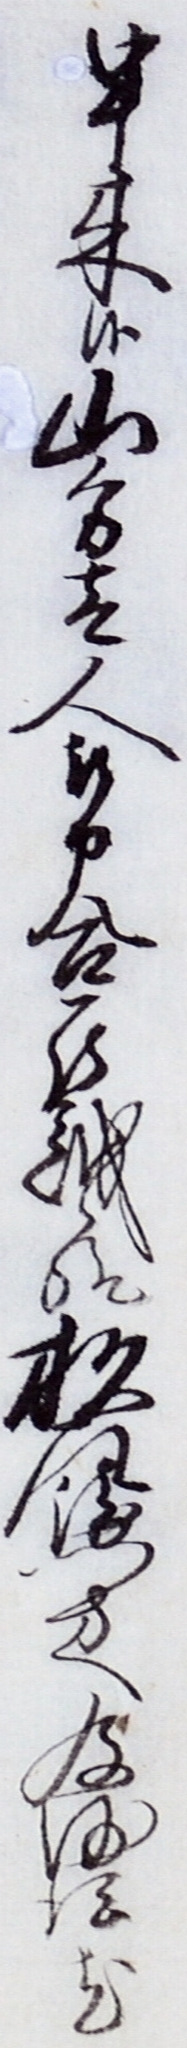申来候山方壱人被申合罷越候様杉左衛門方へ及沙汰尤
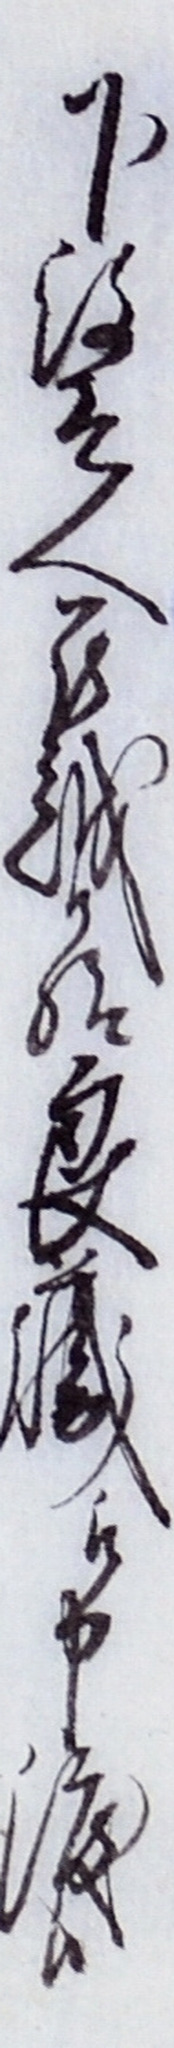下役壱人罷越候様良蔵江申渡候
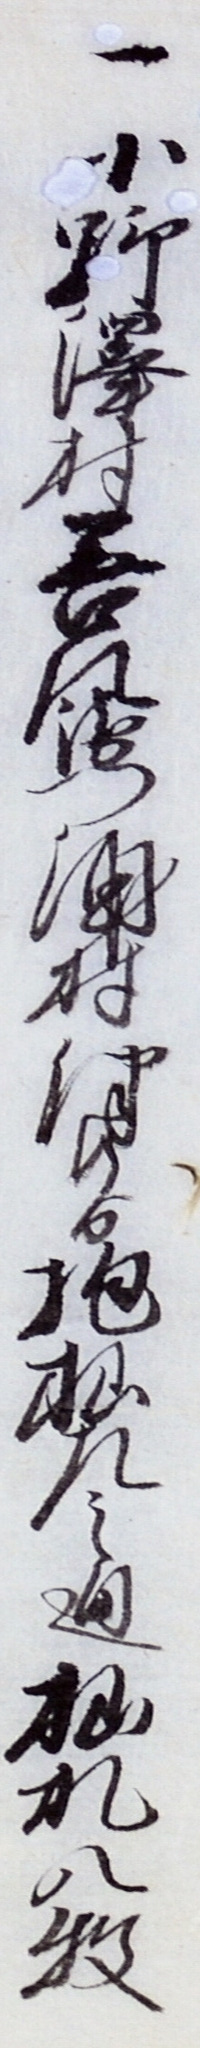一小野澤村善左衛門浦村伴左衛門抱杣左之通杣札八枚
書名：御山奉行御用控
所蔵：伊那市立高遠町図書館・合同会社AMANE
